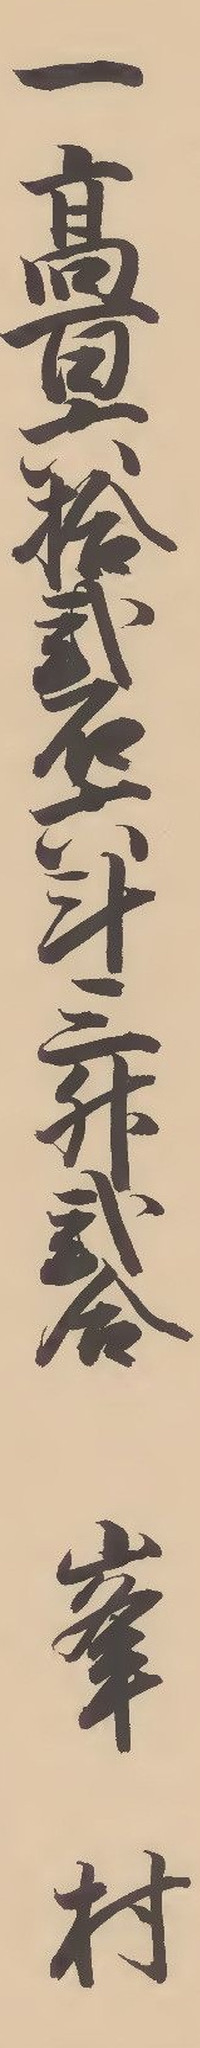一高百六拾弐石六斗三升弐合峯村
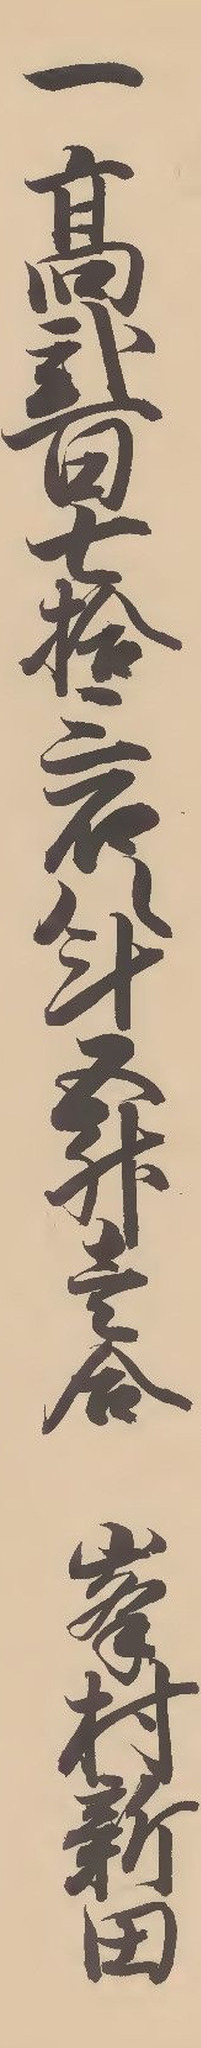一高弐百七拾三石八斗五升壱合峯村新田
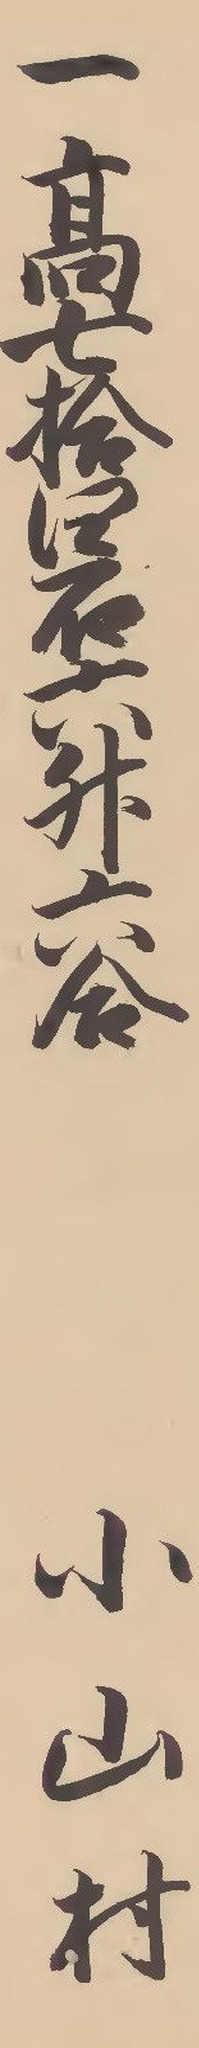一高七拾四石六升六合小山村
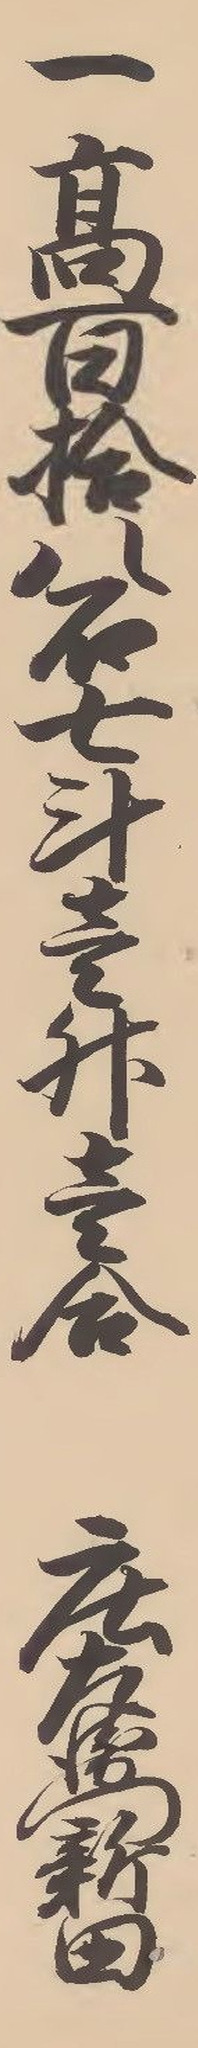一高百拾八石七斗壱升壱合庄左衛門新田
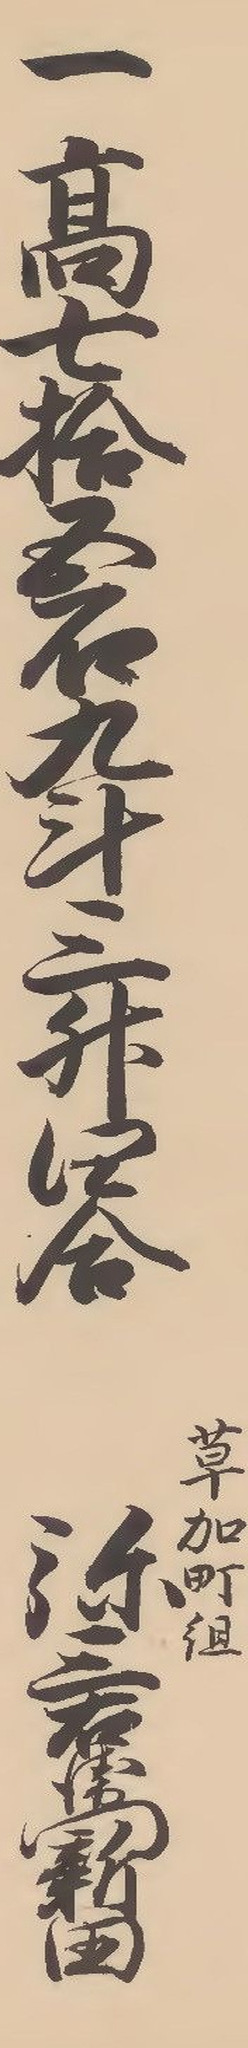一高七拾五石九斗三升四合弥三右衛門新田
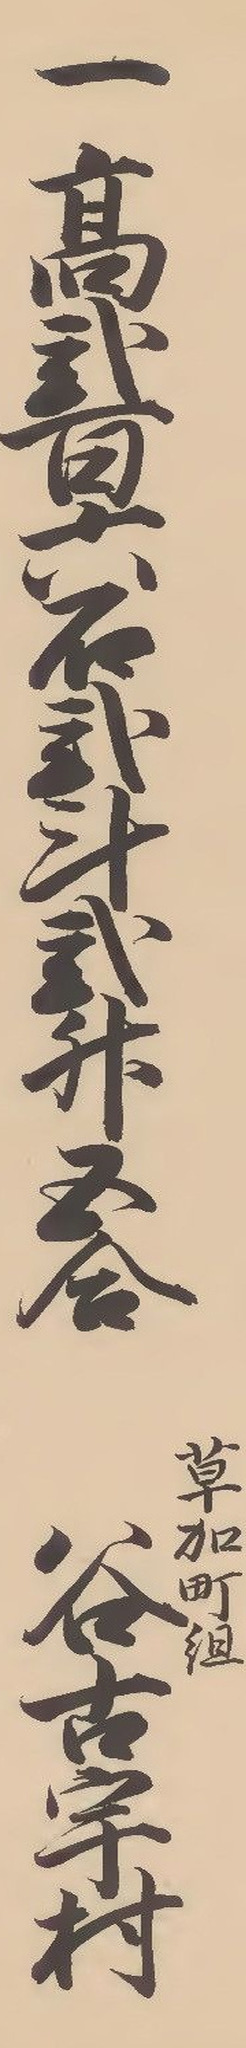一高弐百六石弐斗弐升五合谷古宇村
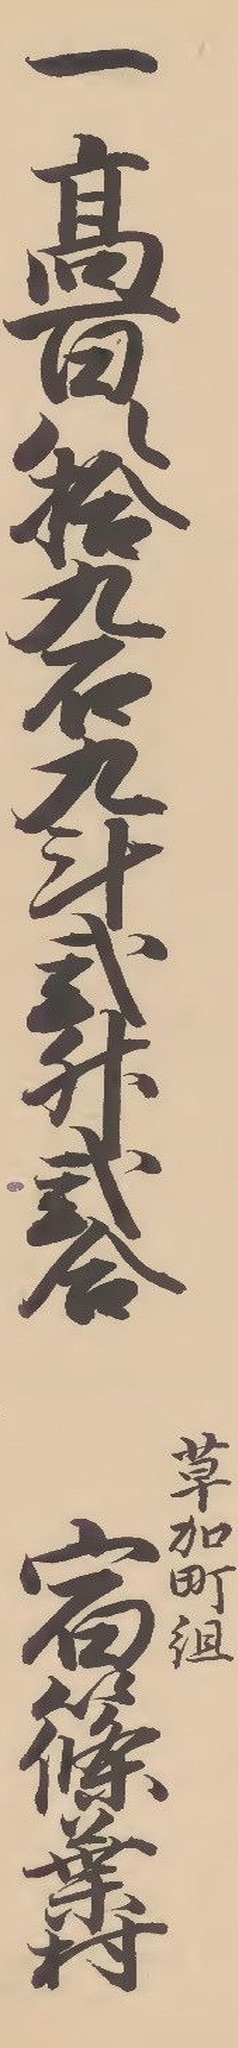一高百八拾九石九斗弐升弐合宿篠葉村

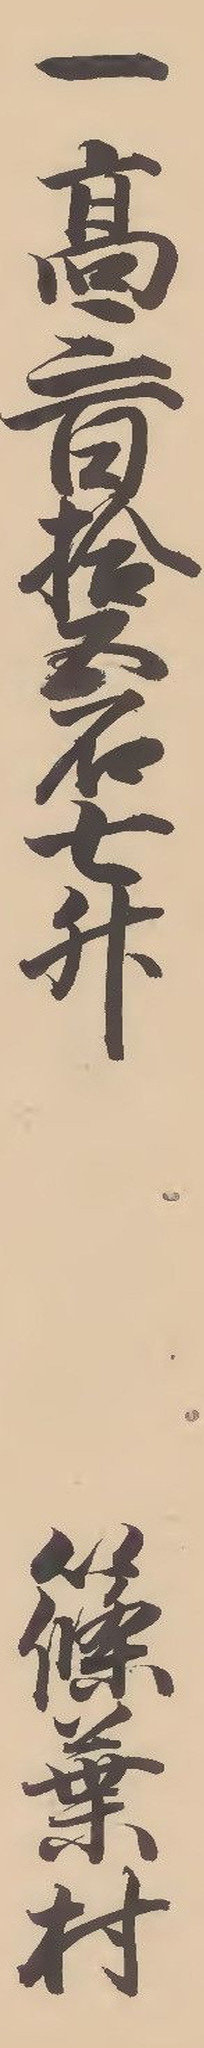一高三百拾五石七升篠葉村
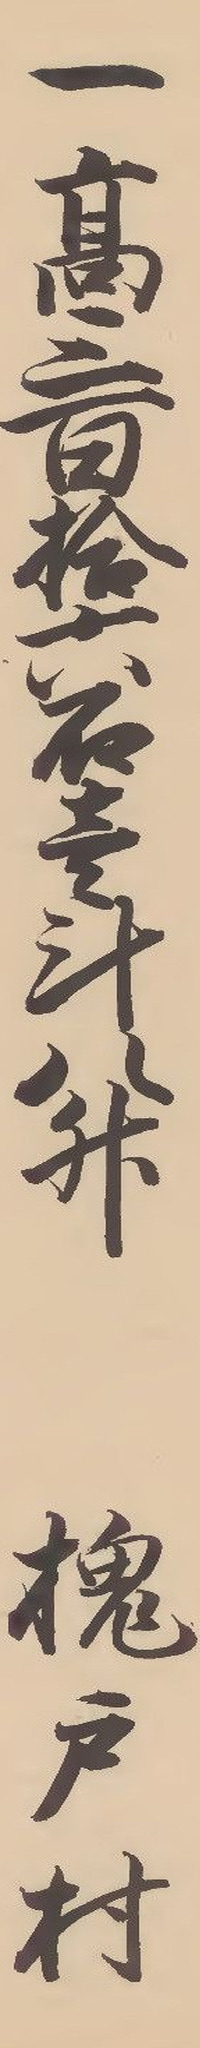一高三百拾六石壱斗八升槐戸村
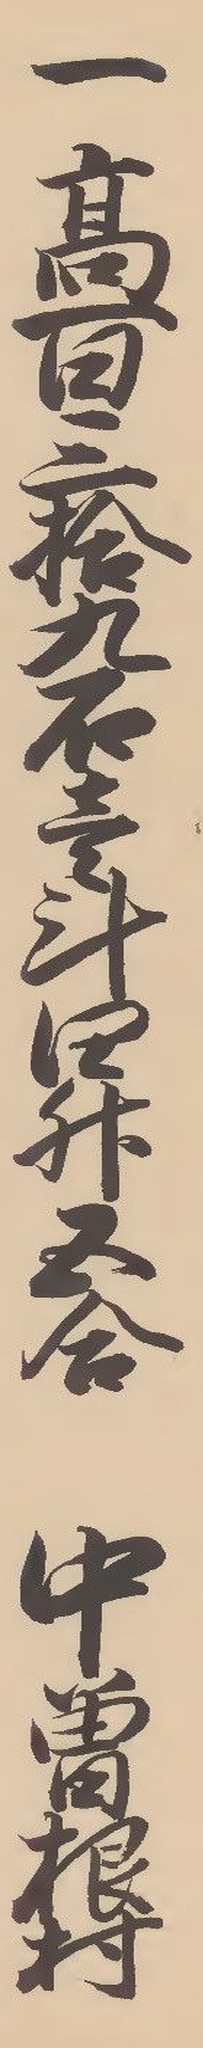一高百三拾九石壱斗四升五合中曽根村
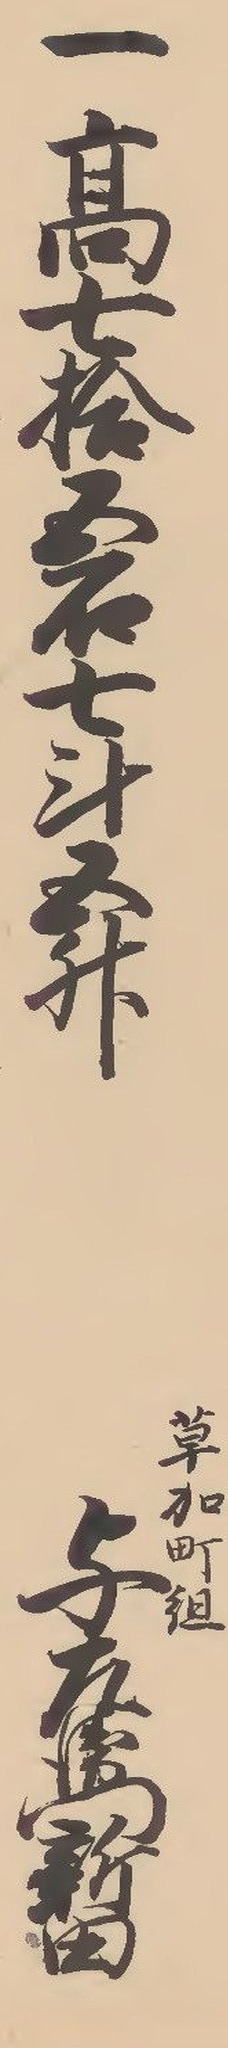一高七拾五石七斗五升与左衛門新田
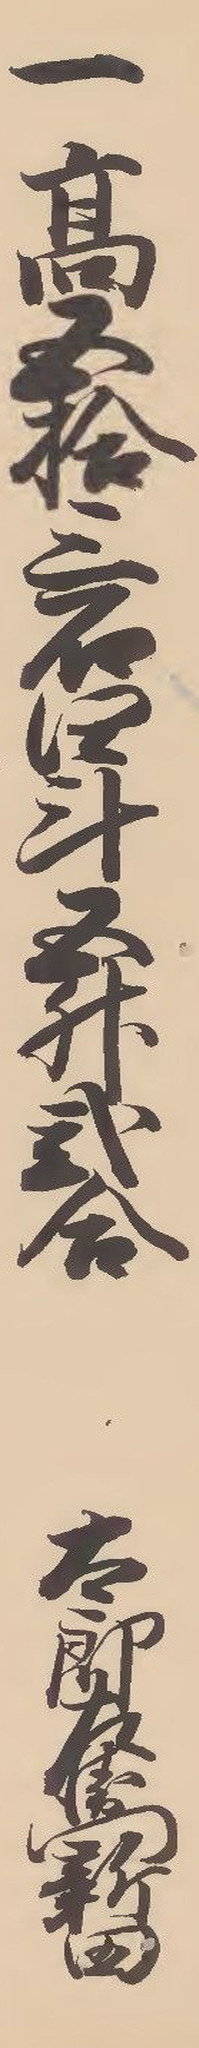一高五拾三石四斗五升弐合太郎左衛門新田
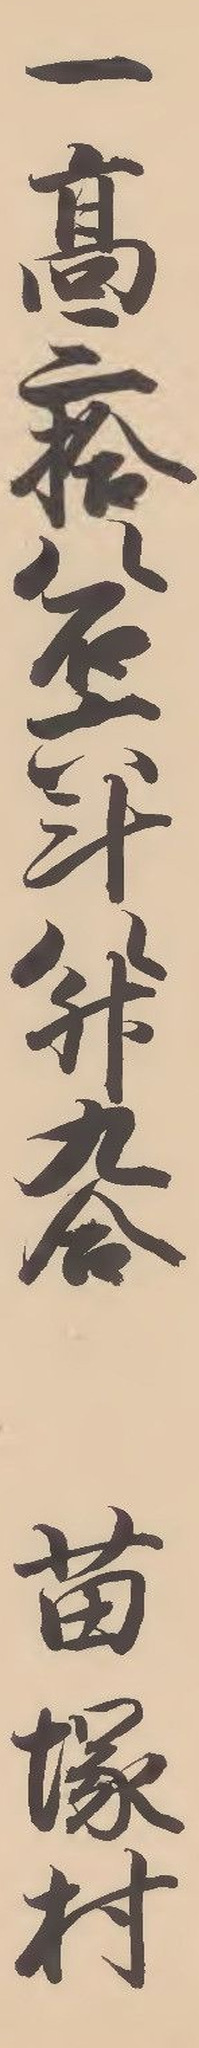一高三拾八石六斗八升九合苗塚村
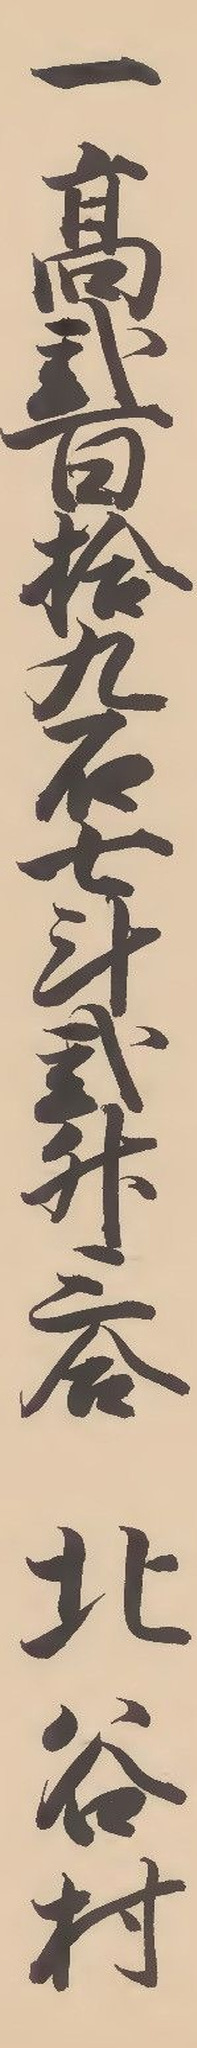一高弐百拾九石七斗弐升三合北谷村
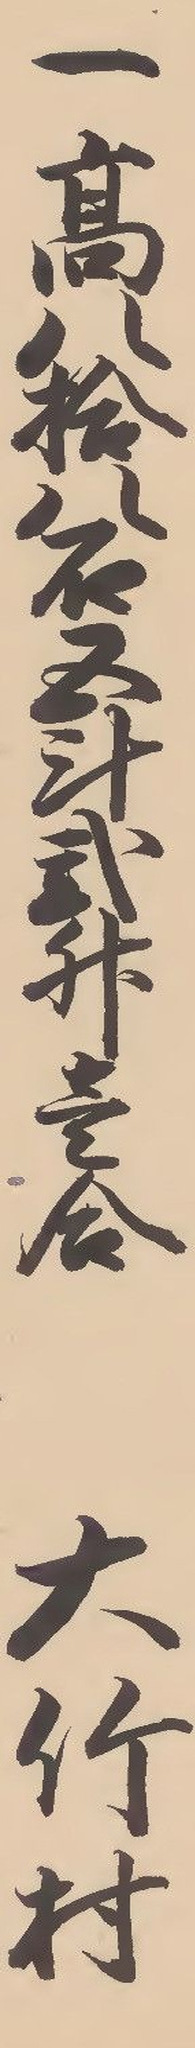一高八拾八石五斗弐升壱合大竹村

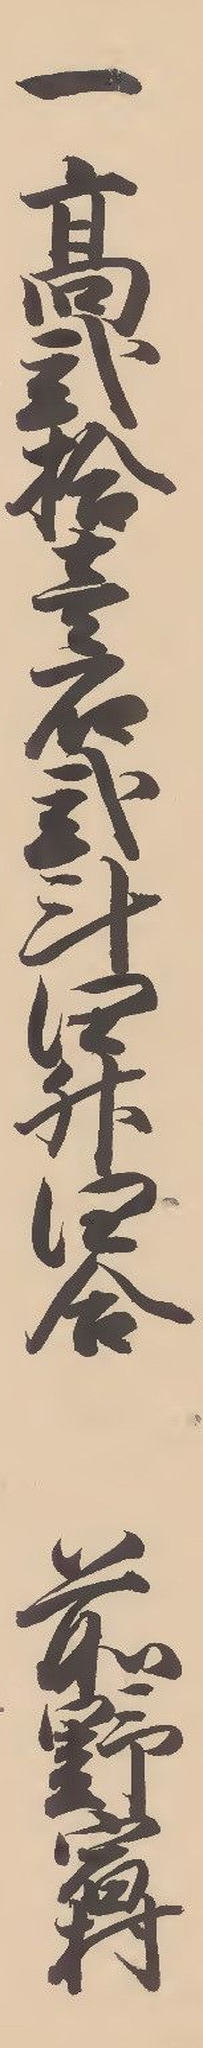一高弐拾壱石弐斗四升四合前野宿村
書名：武蔵国郷帳　下
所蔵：国立公文書館 National Archives of Japan
